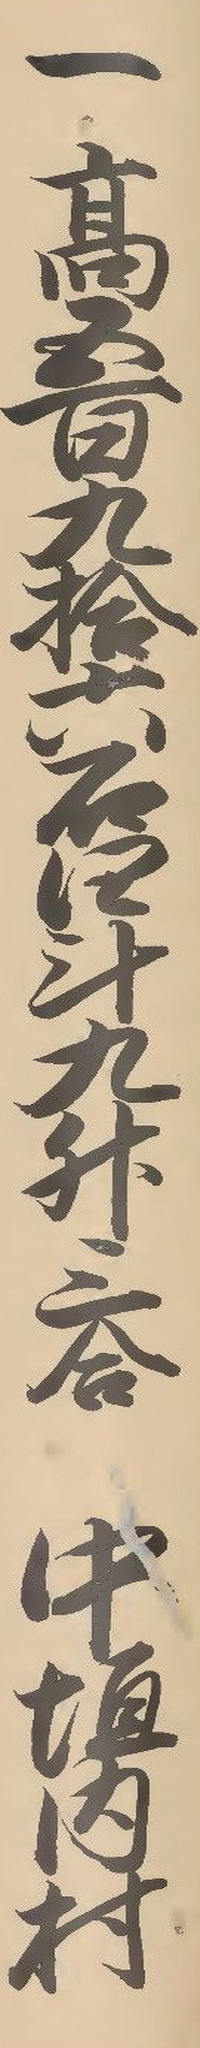一髙五百九拾六石四斗九升三合中垣内村
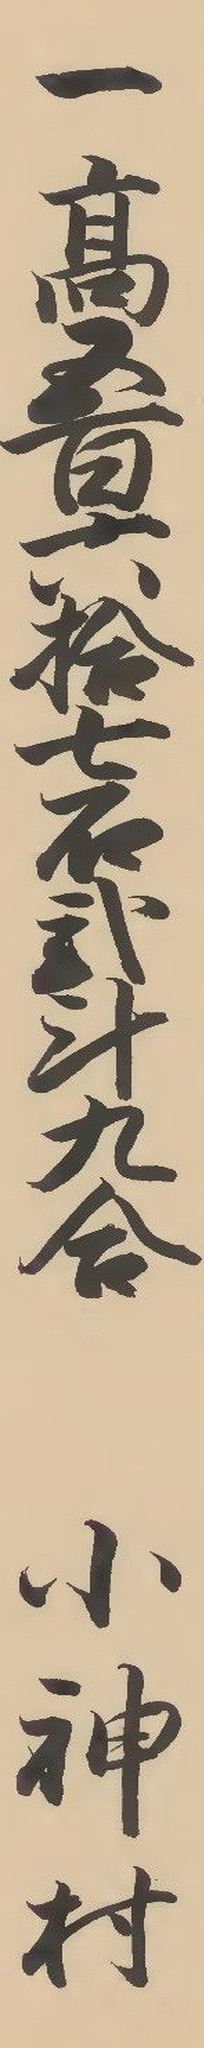一髙五百六拾七石弐斗九合小神村
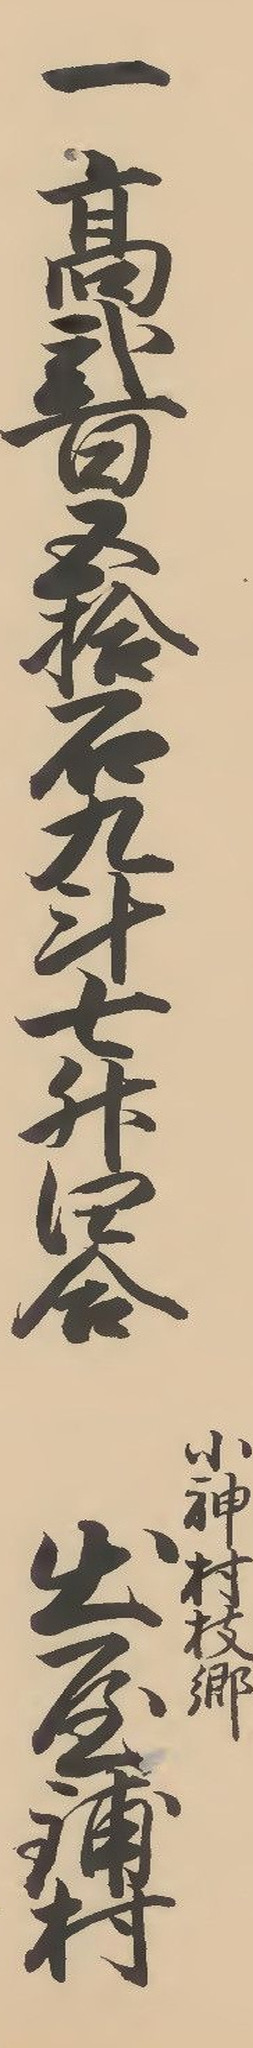一髙弐百五拾石九斗七升四合出屋鋪村
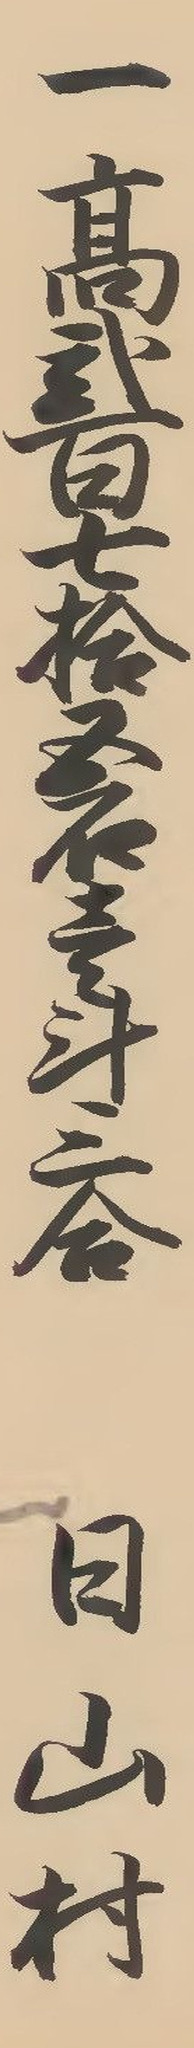一髙弐百七拾五石壱斗三合日山村

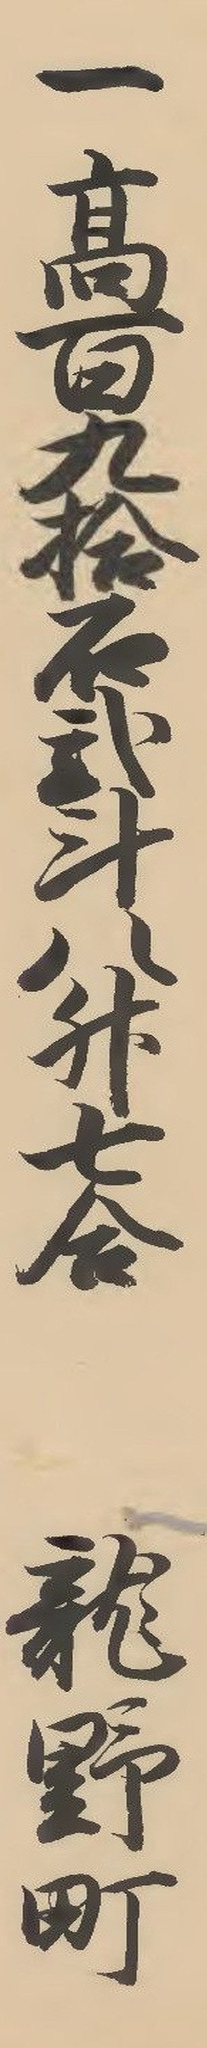一髙百九拾石弐斗八升七合龍野町
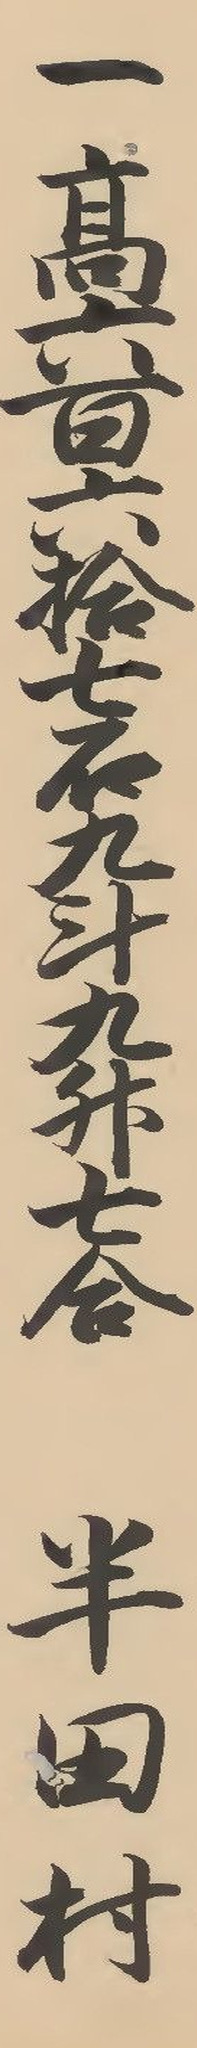一髙六百六拾七石九斗九升七合半田村
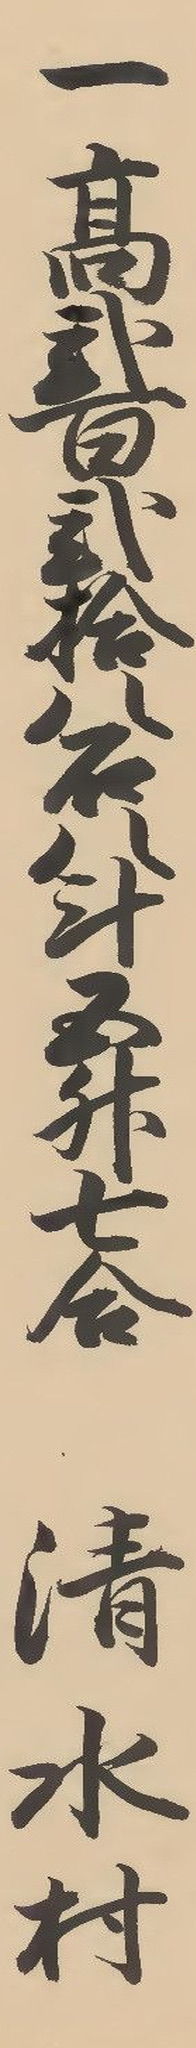一髙弐百弐拾八石八斗五升七合清水村
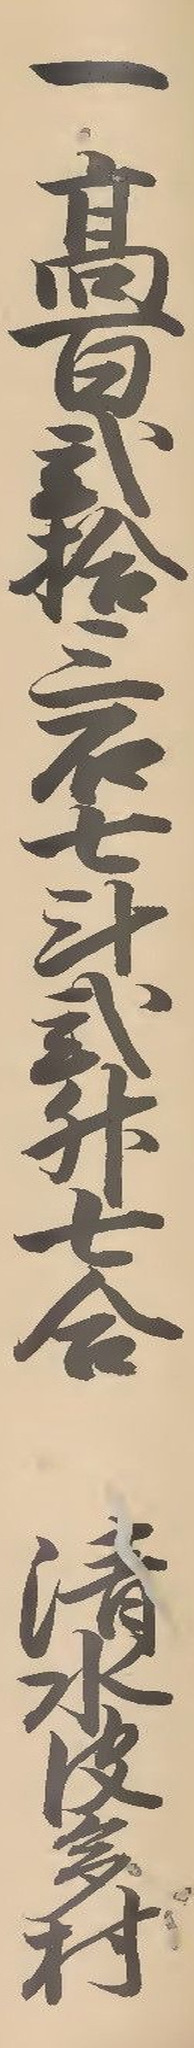一髙百弐拾三石七斗弐升七合清水皮多村
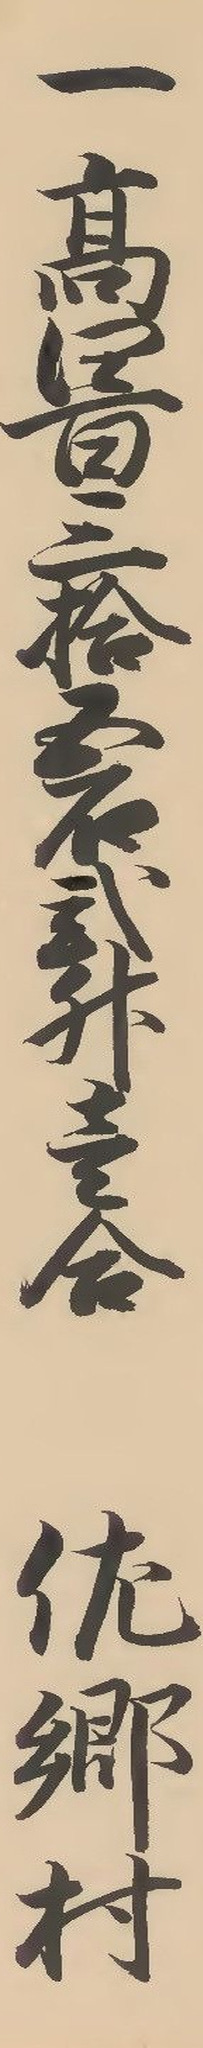一髙四百三拾五石弐升壱合佐郷村
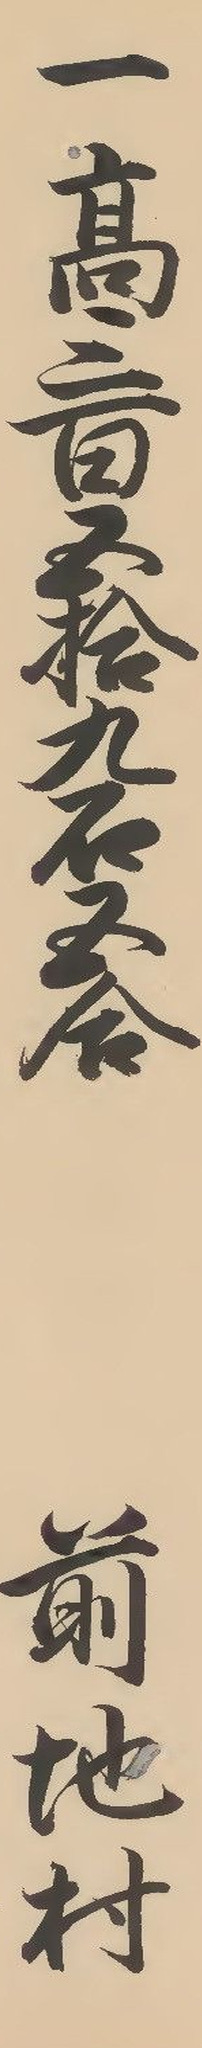一髙三百五拾九石五合前地村
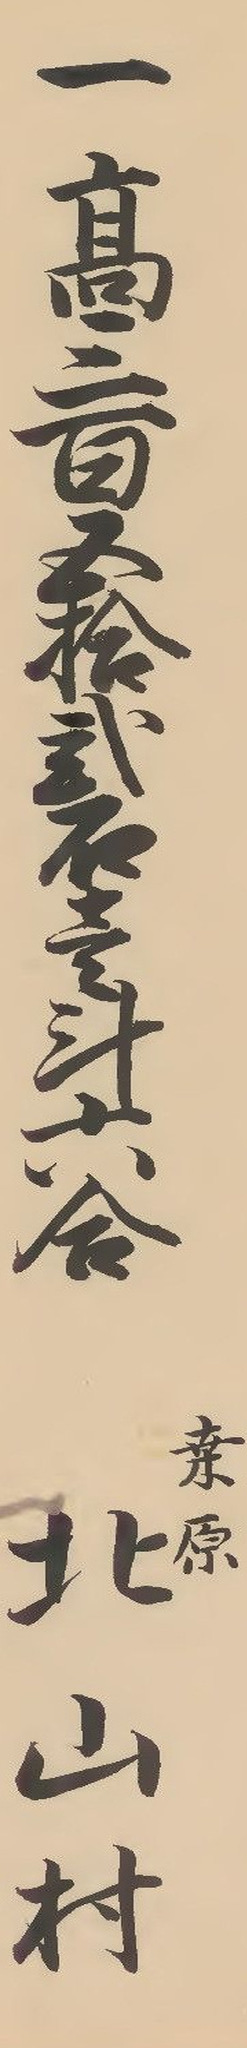一髙三百五拾弐石壱斗六合北山村

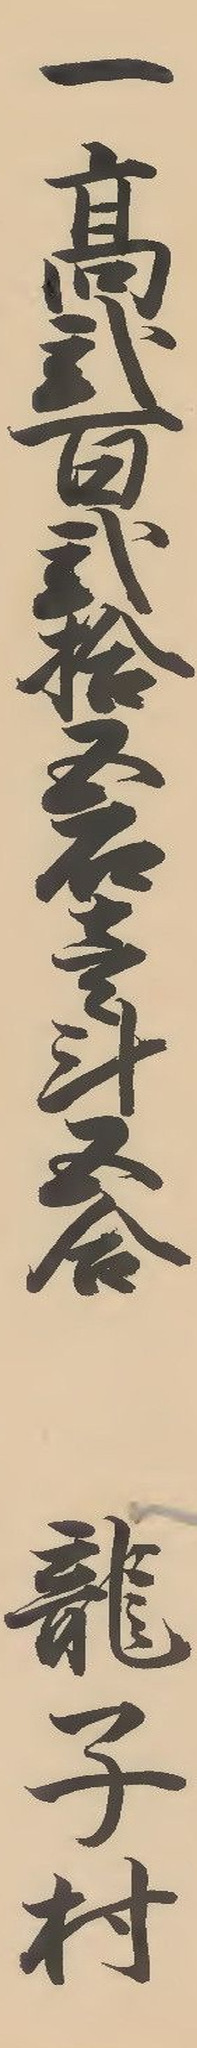一髙弐百弐拾五石壱斗五合龍子村
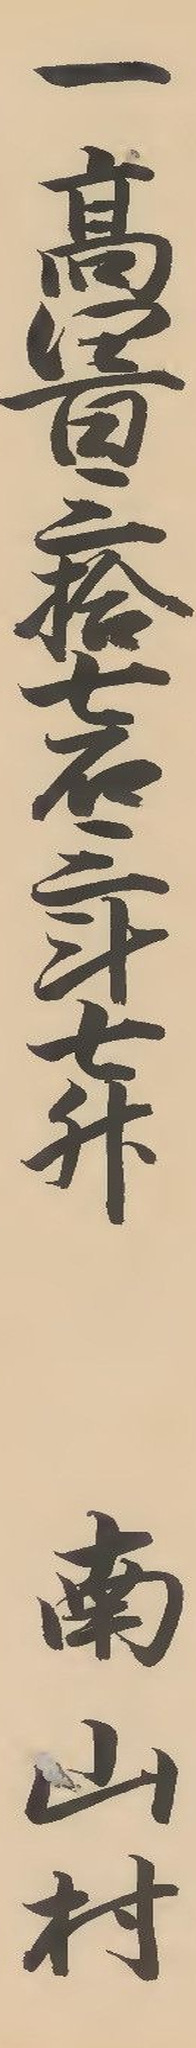一髙四百三拾七石三斗七升南山村
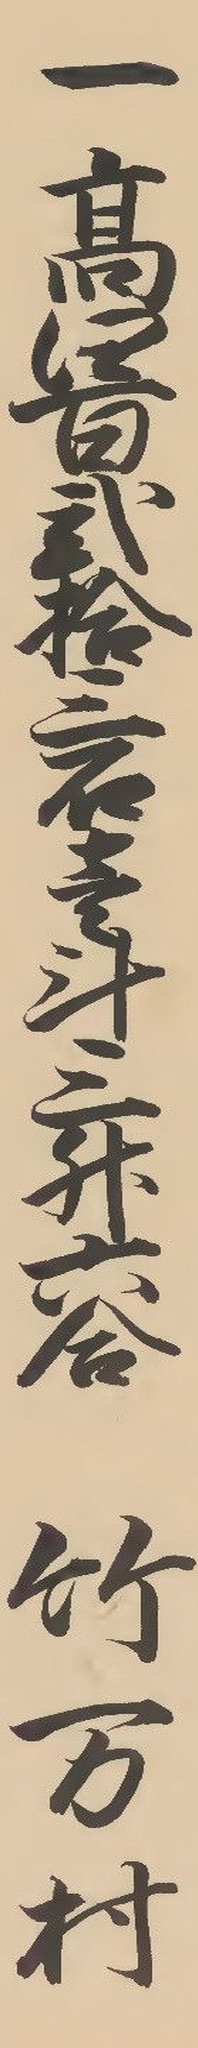一髙四百弐拾三石壱斗三升六合竹万村
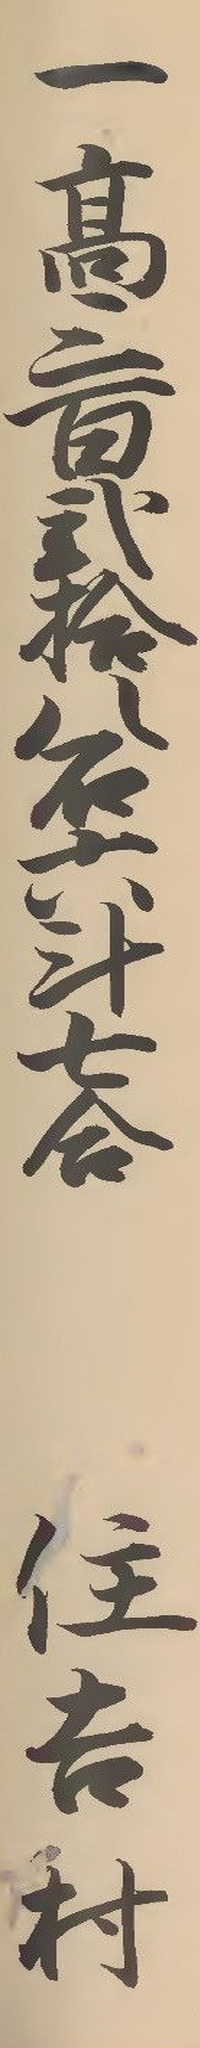一髙三百弐拾八石六斗七合住吉村
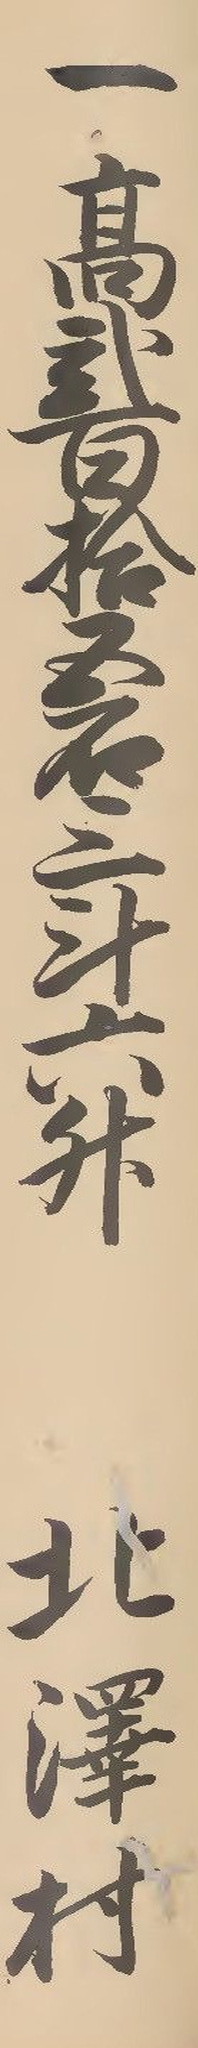一髙弐百拾五石三斗六升北澤村
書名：播磨国郷帳
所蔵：国立公文書館 National Archives of Japan
